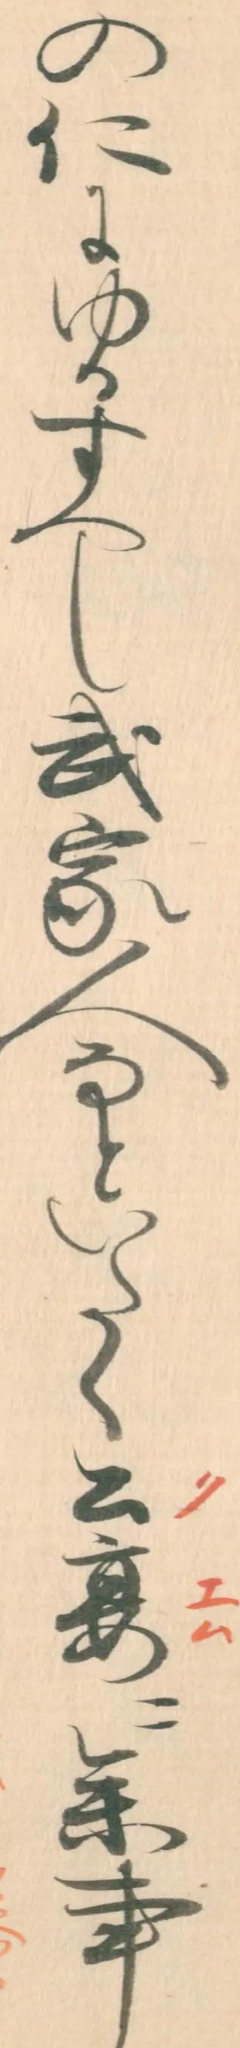の仁にゆるすへし武家人なといたく公宴に参事
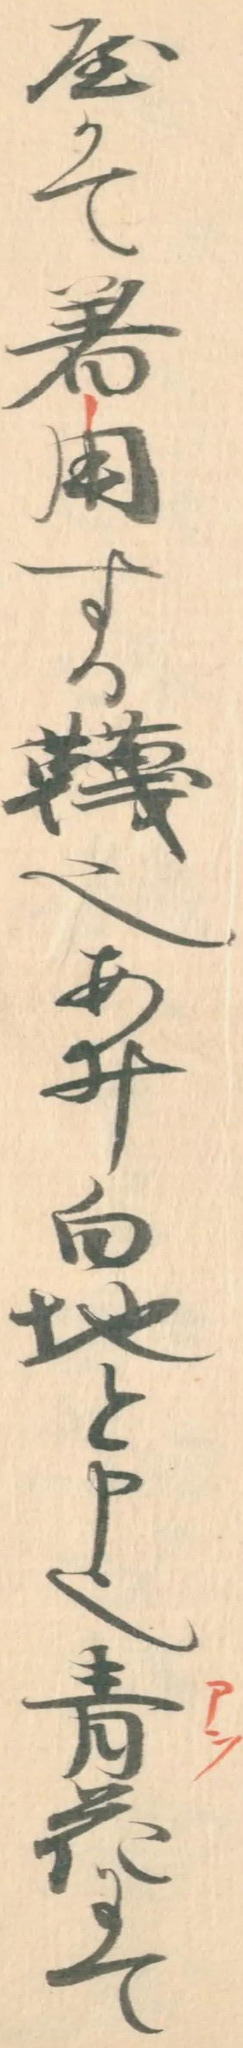やかて着-用する韈也あゐ白地と申也青花にて
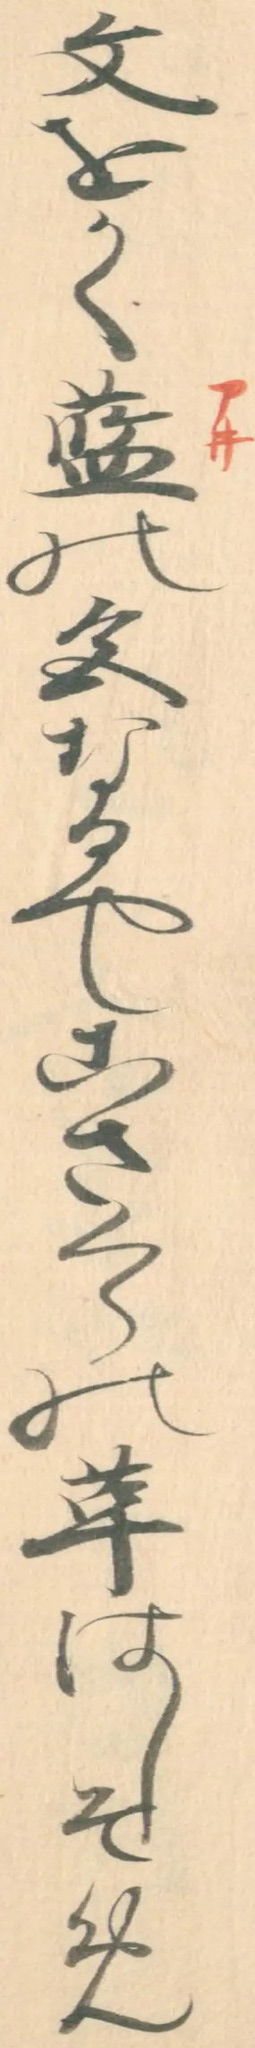文をかく藍の色なるへしこさくらの革はしそめ

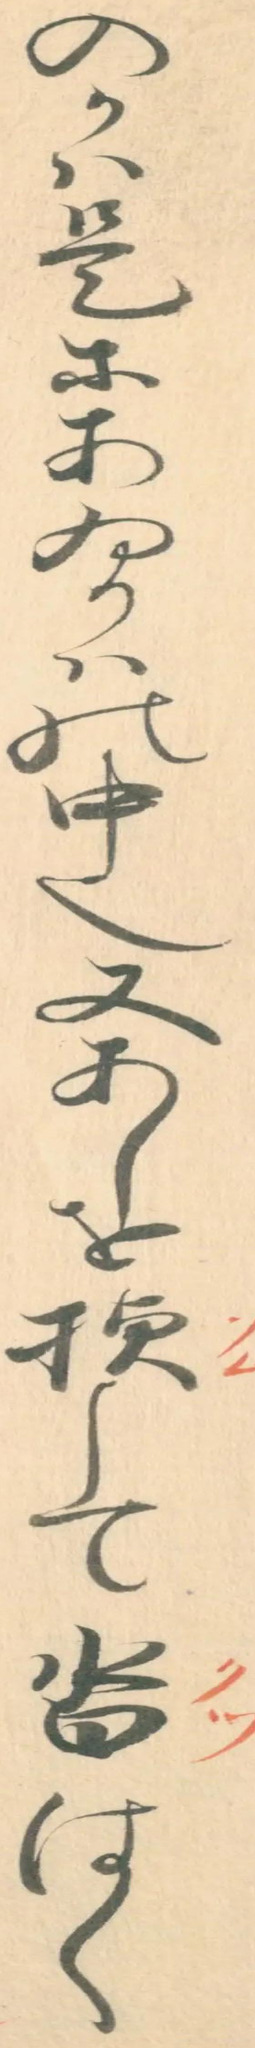のかは是等あゐかはの申也又あしを損して沓はく
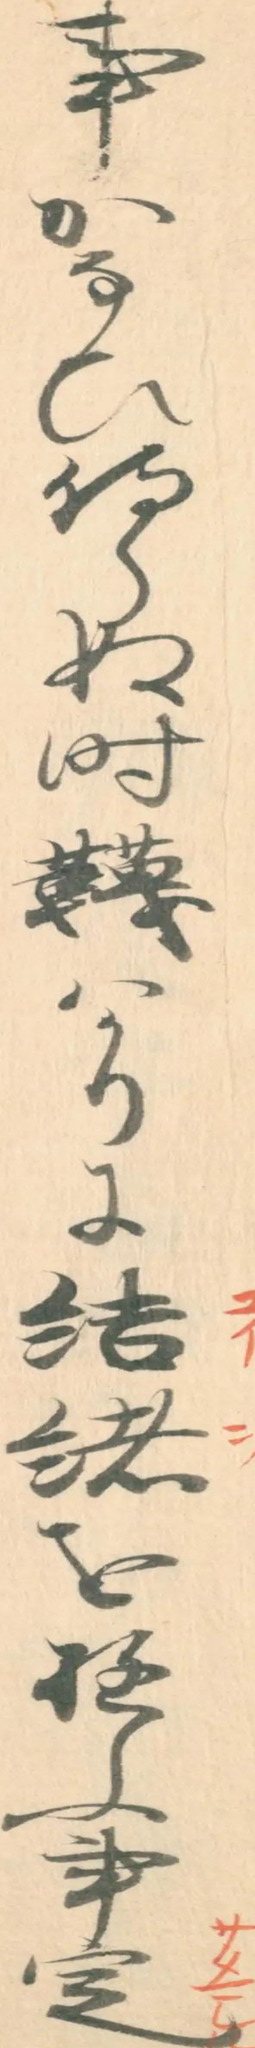事かなひ侍らぬ時韈はかりに結緒をゆふ事定
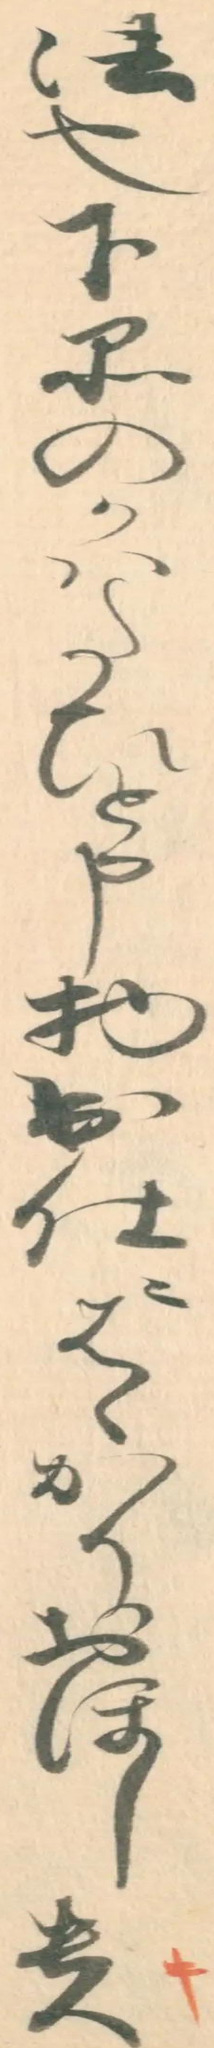法也下品のかはたひと申物出仕にはゝかりおほし貴
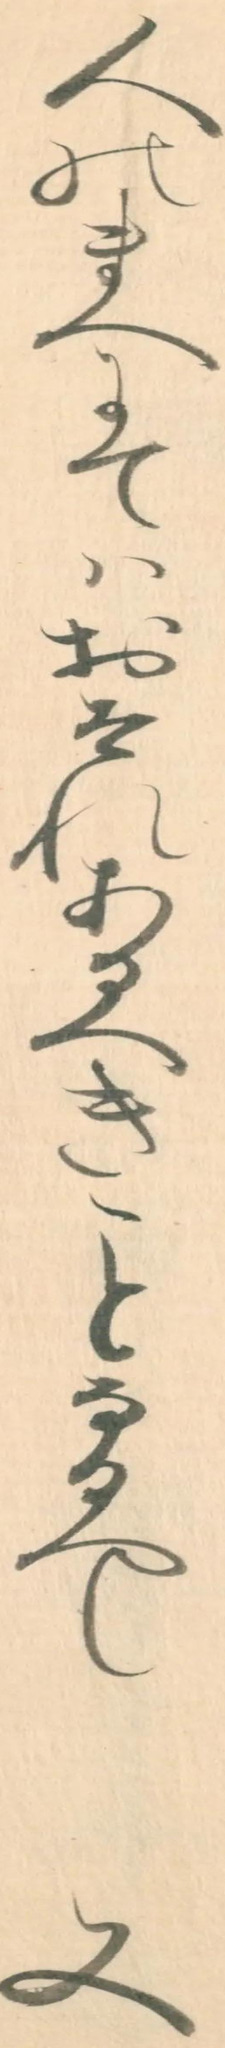人のまへにてはおそれあるへきことなるへし又
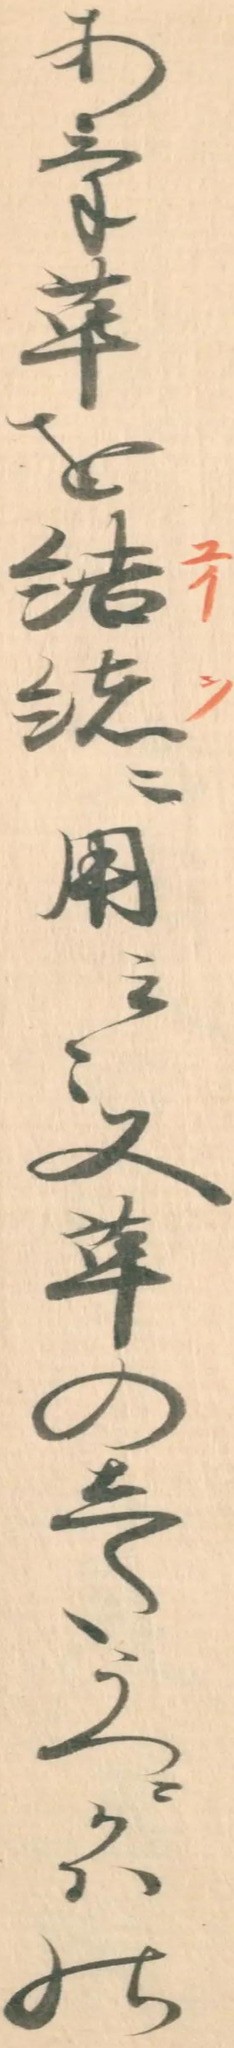あけ革を結緒に用云々又革のしたうつにかはの
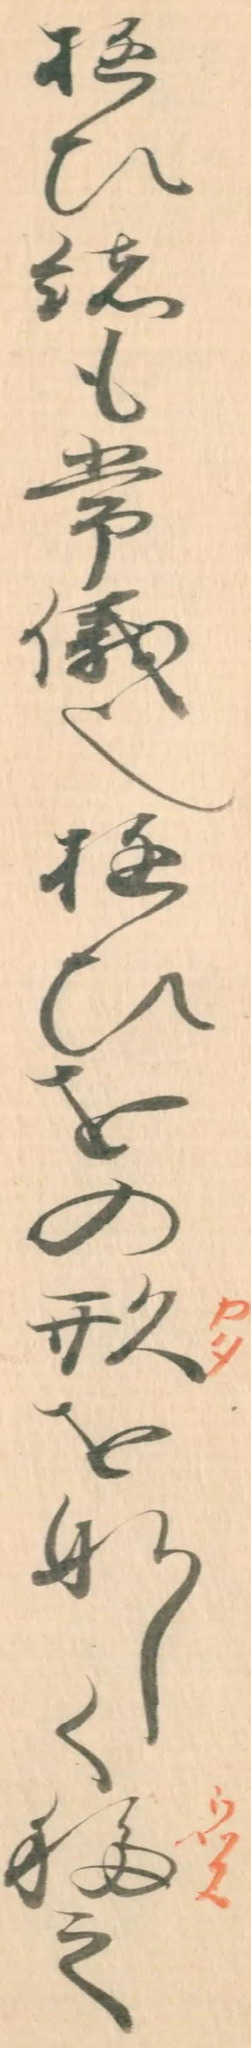ゆひ緒も常儀也ゆひをの形をなしく移之

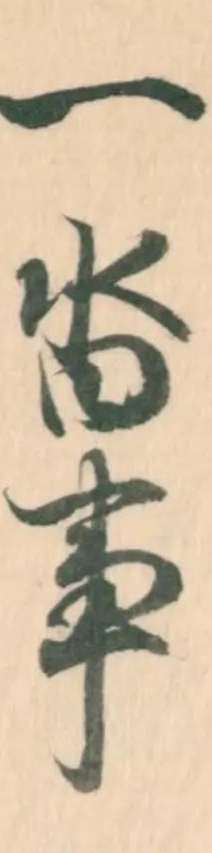一沓事
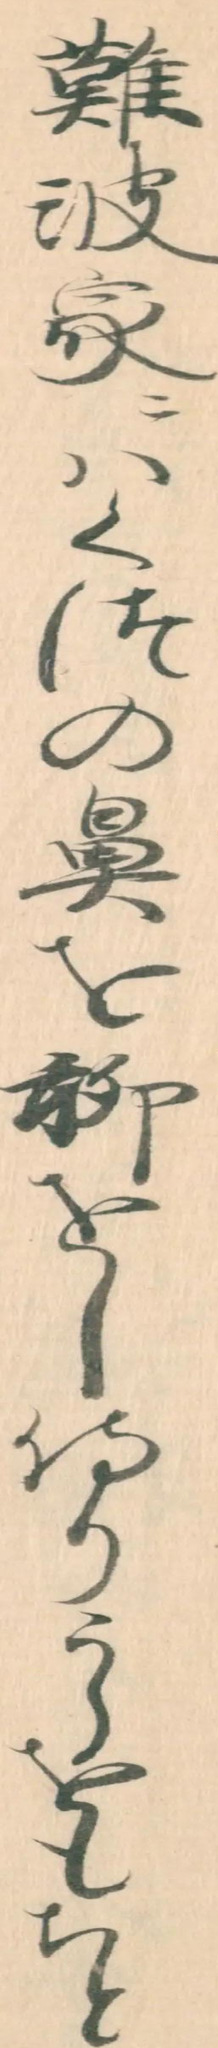難波家にはくつの鼻を聊をし侍りうらをもちと
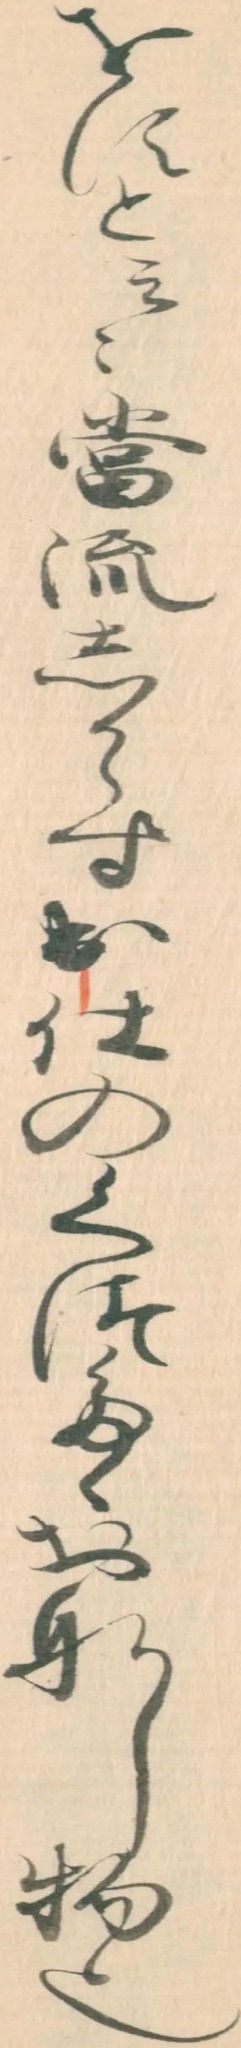をすと云々當流しからす出-仕のくつたゝおなし物也
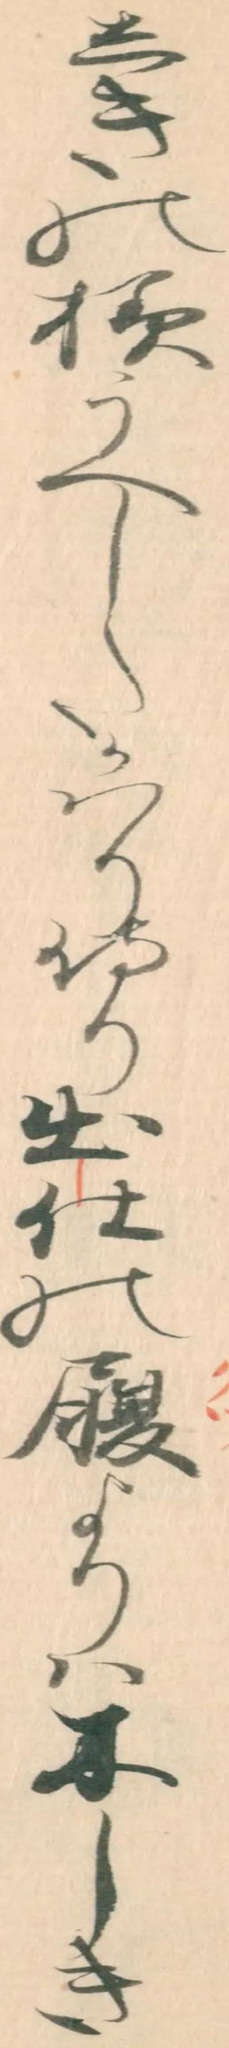しきの様うへしたかはり侍り出-仕の履よりは木しき
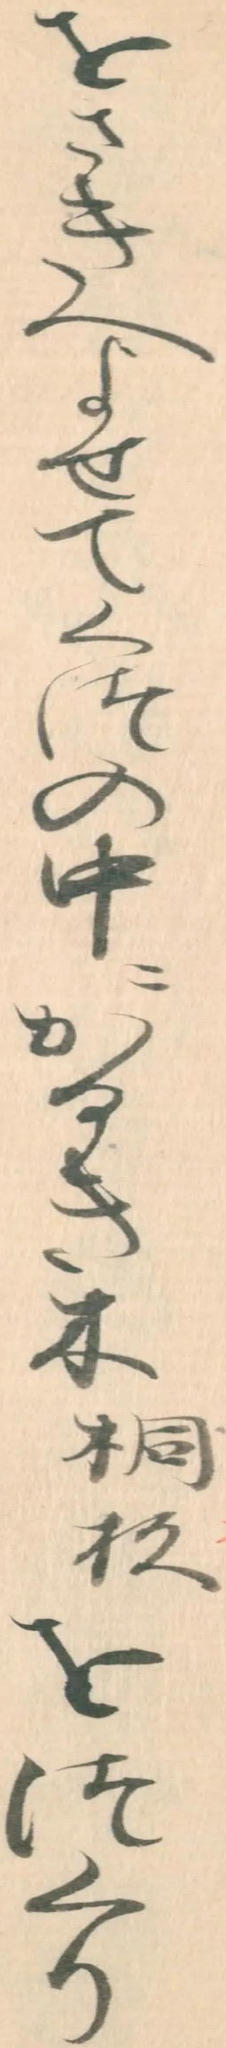をさきへよせてくつの中にかるき木桐杦をつくり
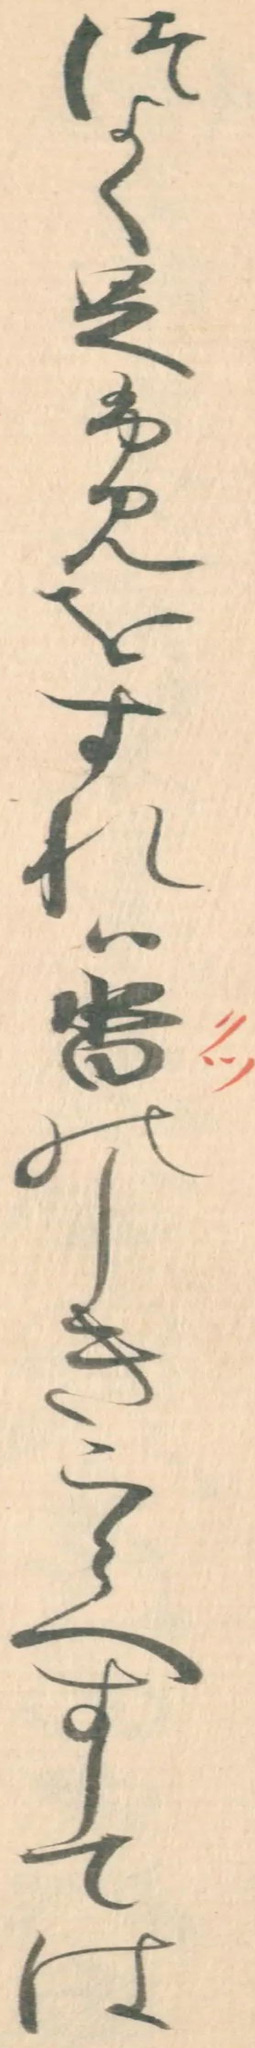つよく足ふみをすれは沓のしきこらへすしては

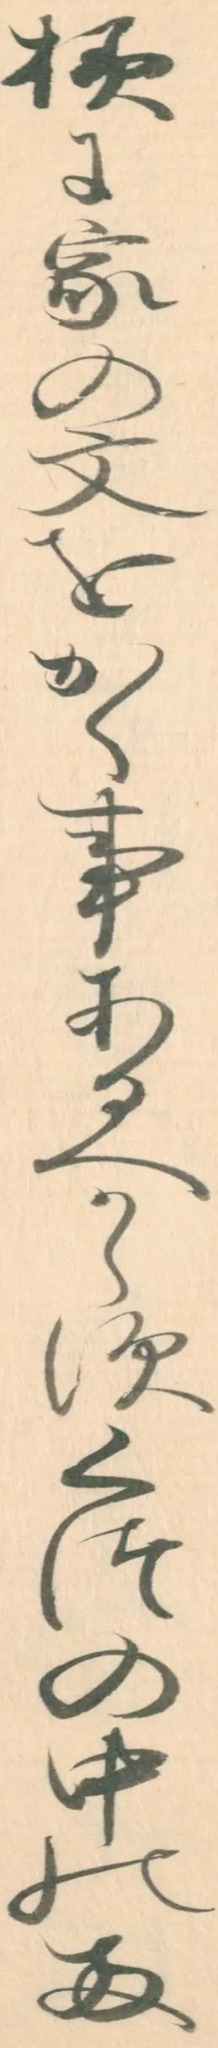様に家の文をかく事あるへからすくつの中の両
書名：遊庭秘抄 2巻. [1]
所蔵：国立国会図書館 National Diet Library, JAPAN
